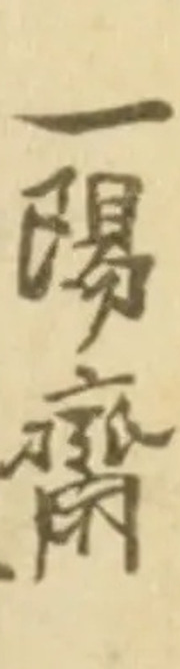一陽斎
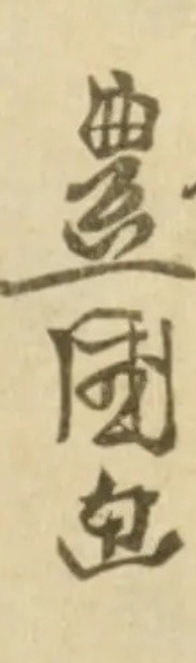豊国画
